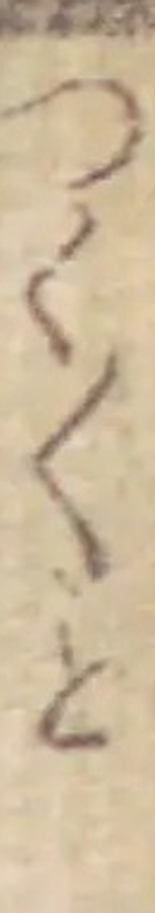つく〳〵と
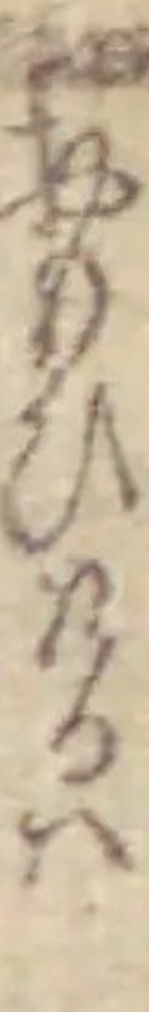おもひけるは
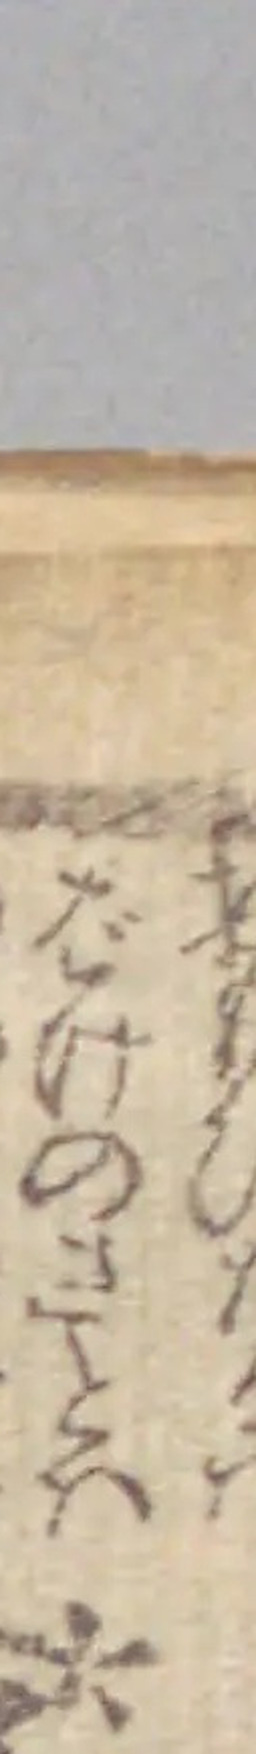ばけのさとは
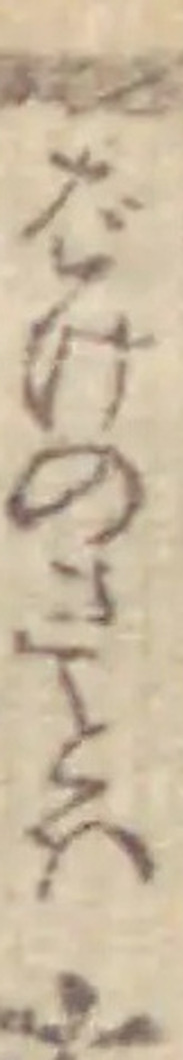ばけのさとは
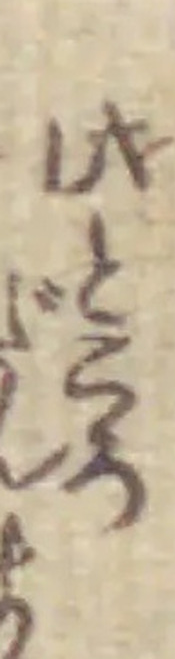此ところ
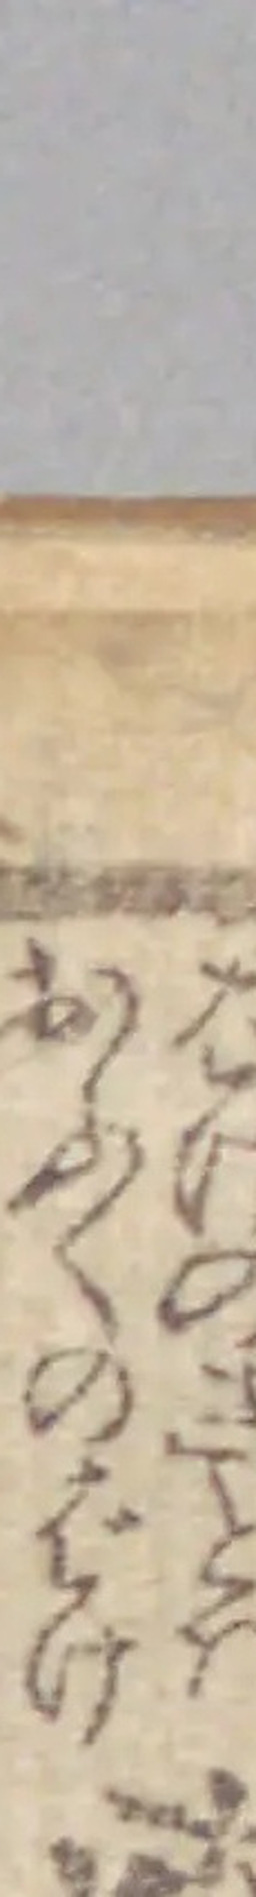おふくのばけ
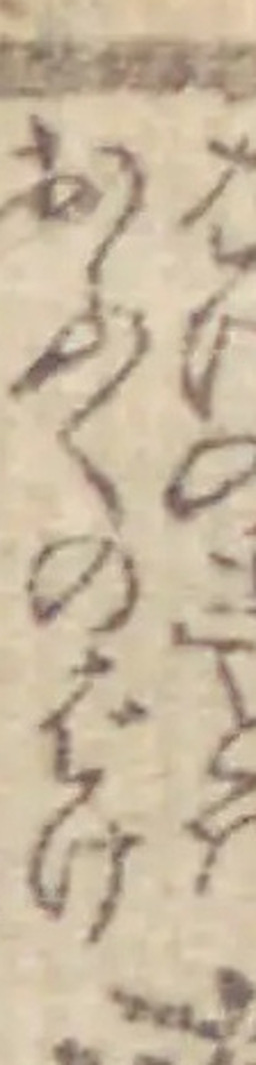おふくのばけ
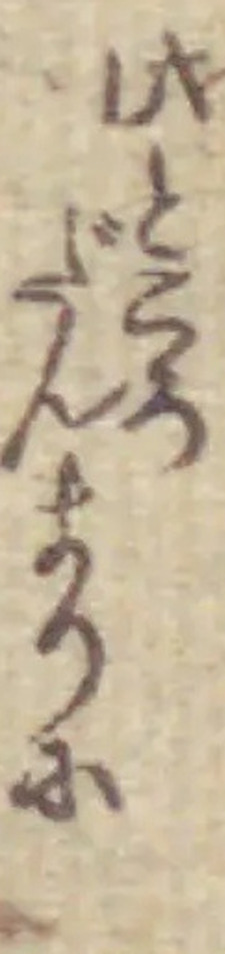だんまりに
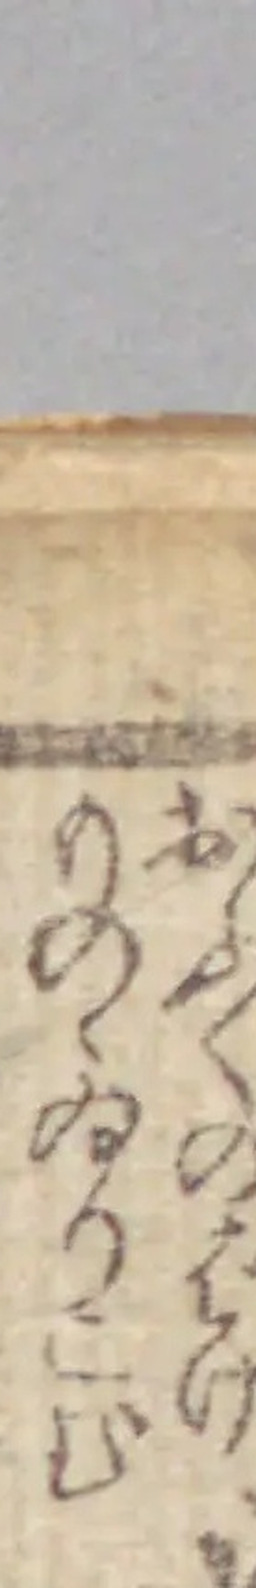ものゝゐりこむ
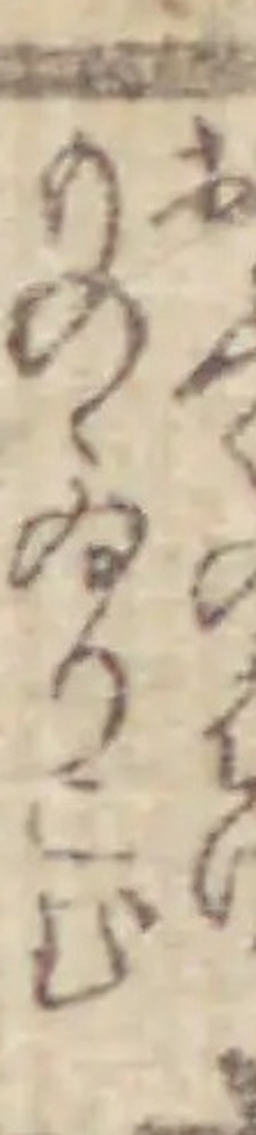ものゝゐりこむ
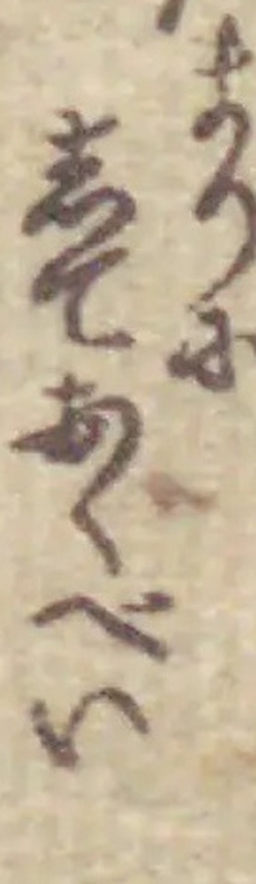しておくべい
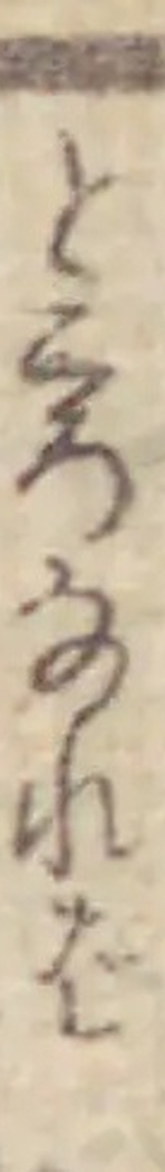ところなれば
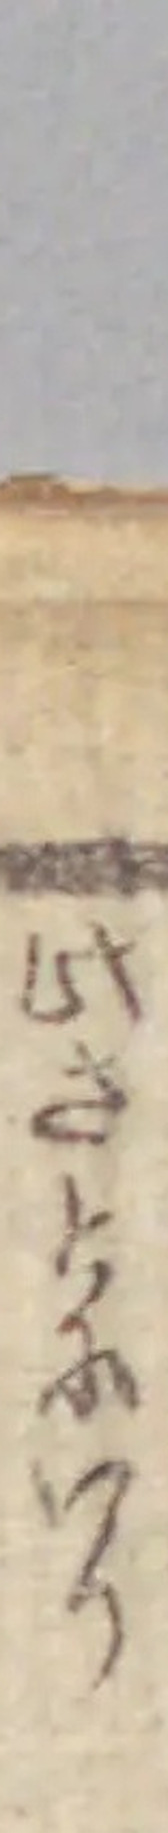此さとにいり
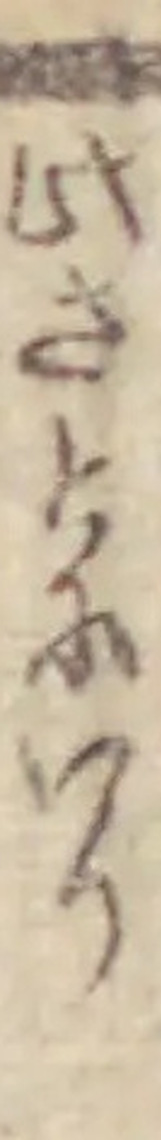此さとにいり
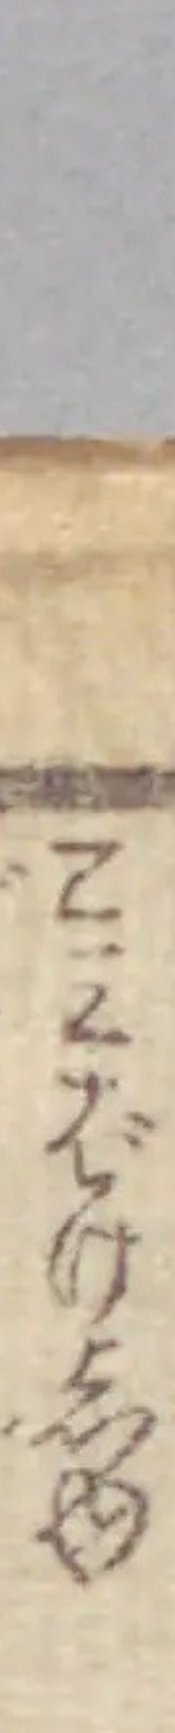こみばけしゆ
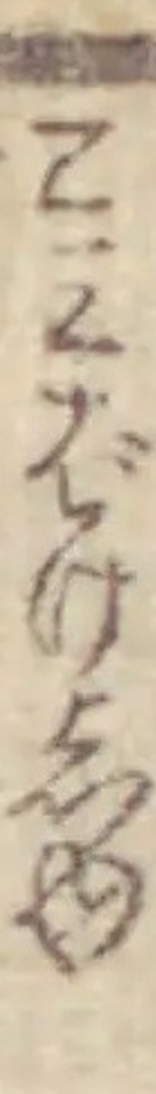こみばけしゆ
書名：大昔化物双紙 2巻
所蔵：国立国会図書館 National Diet Library, JAPAN
